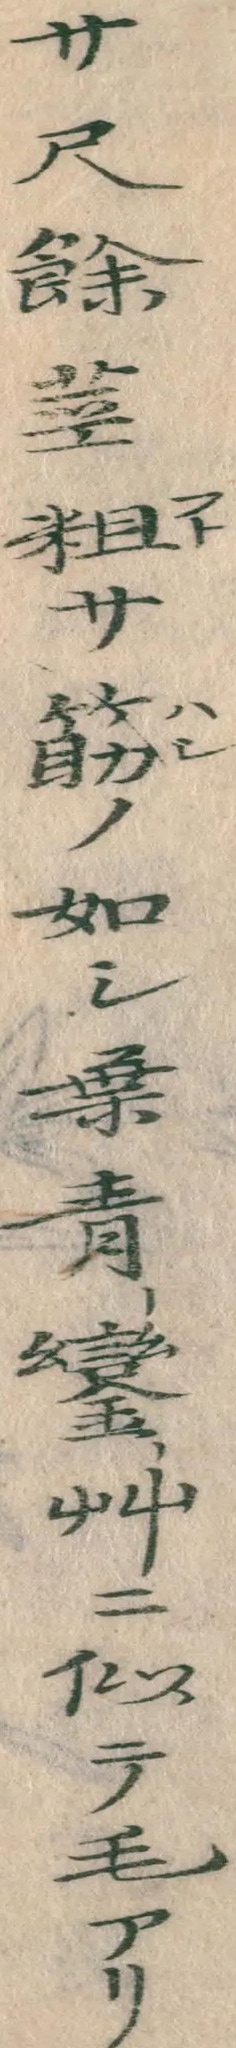サ尺余茎粗サ筋ノ如シ葉青-鑾-草ニ似テ毛アリ
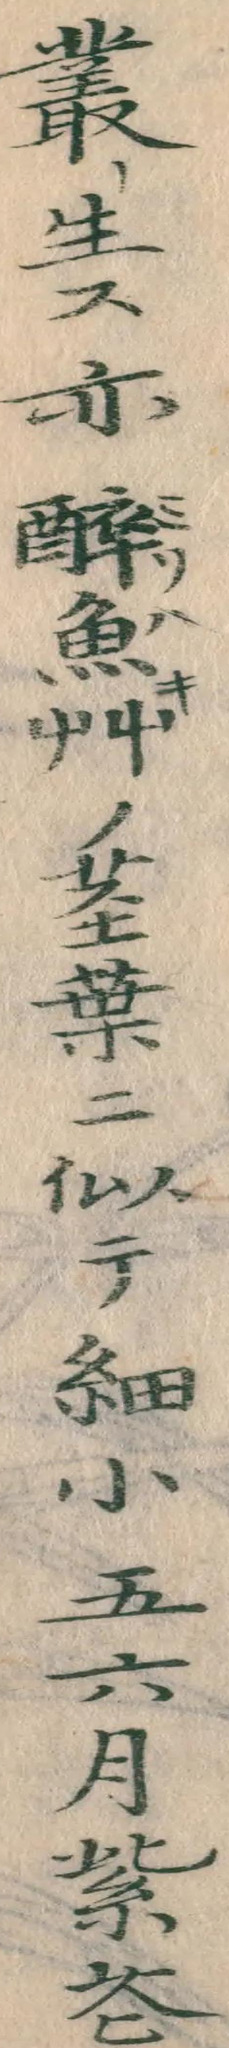叢-生ス亦酔魚草ノ茎葉ニ似テ細小五六月紫花
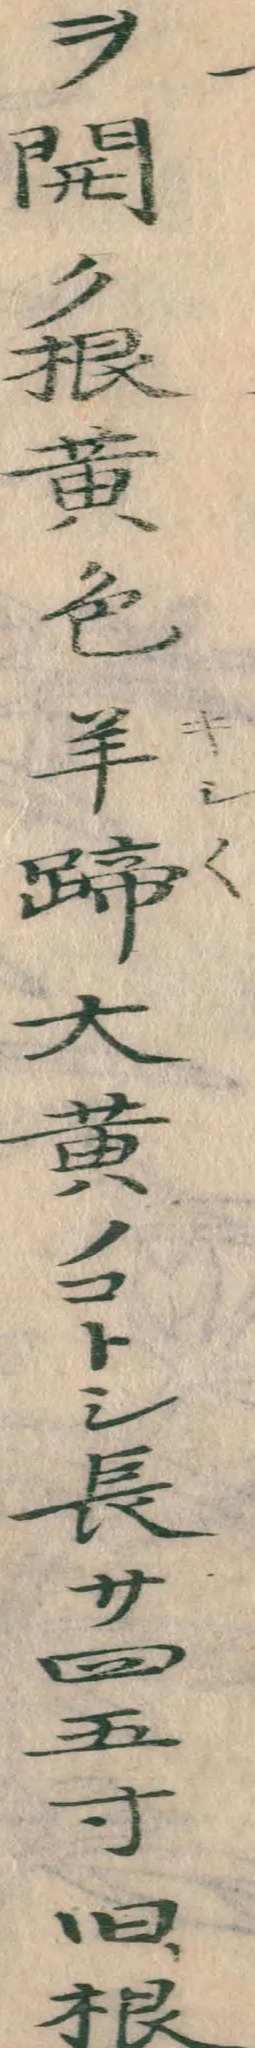ヲ開ク根黄色羊蹄大黄ノコトシ長サ四五寸旧-根
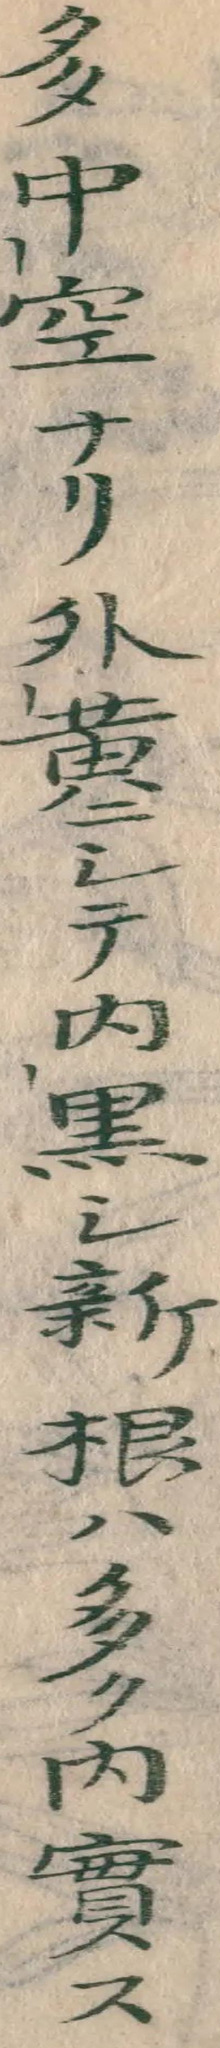多中-空ナリ外-黄ニシテ内-黒シ新根ハ多ク内実ス
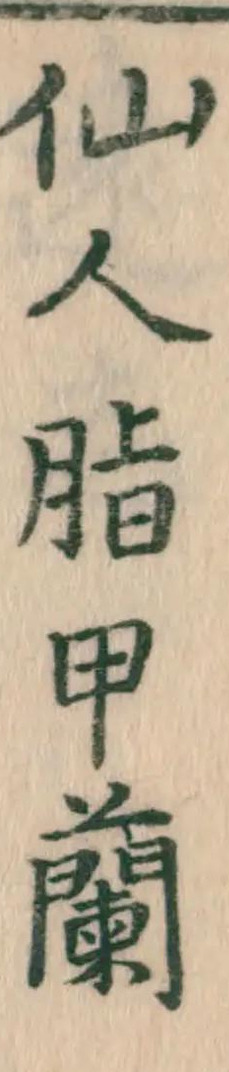仙人脂甲蘭

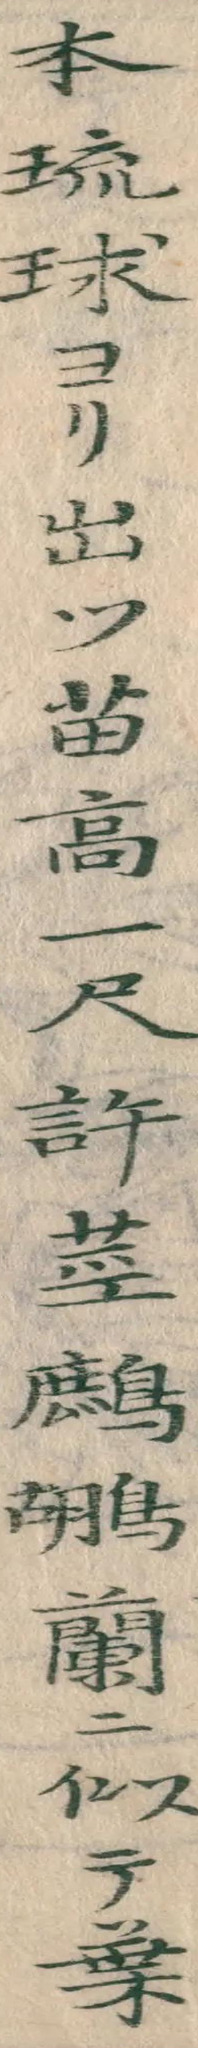本琉球ヨリ出ツ苗高一尺許茎鷓鶘蘭ニ似テ葉
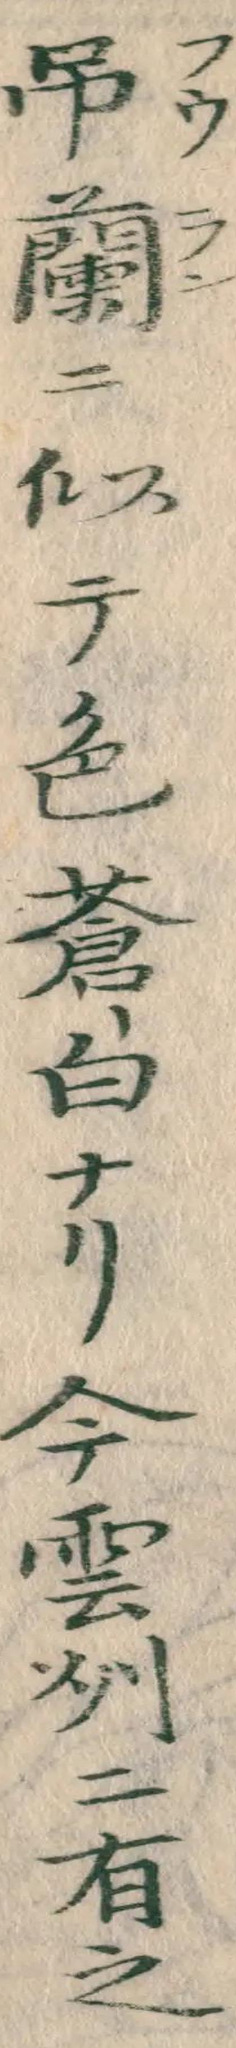吊蘭ニ似テ色蒼-白ナリ今雲州ニ有之

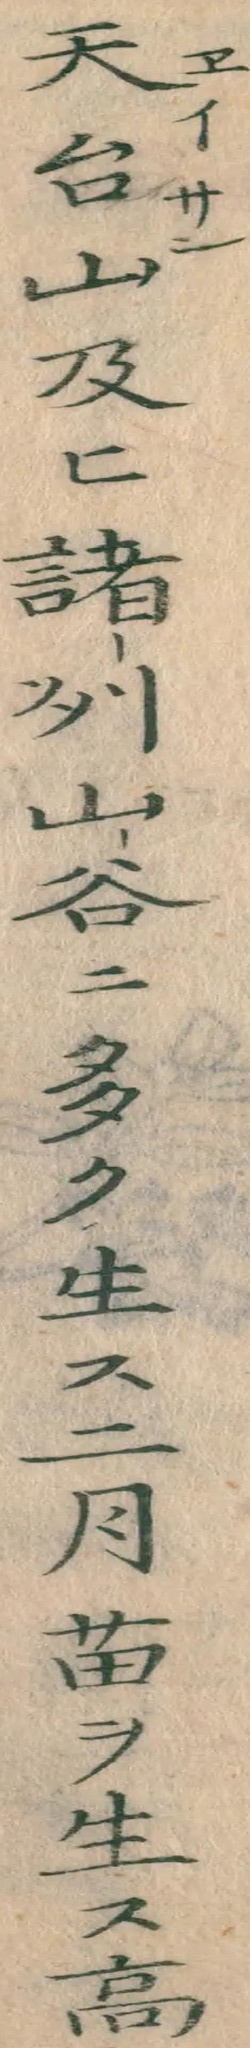天台山及ヒ諸-州山-谷ニ多ク生ス二月苗ヲ生ス高
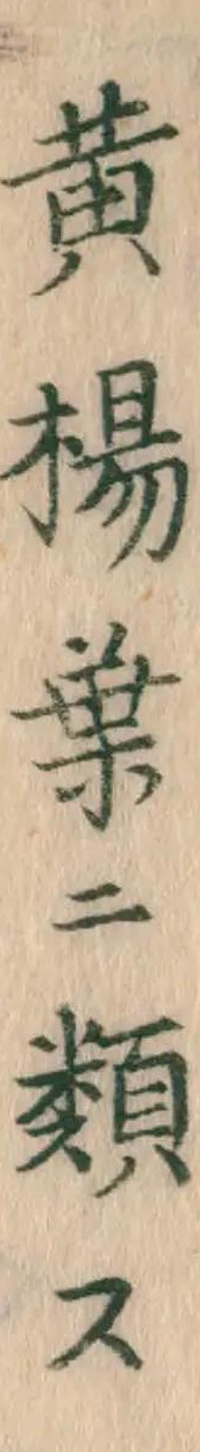黄楊葉ニ類ス
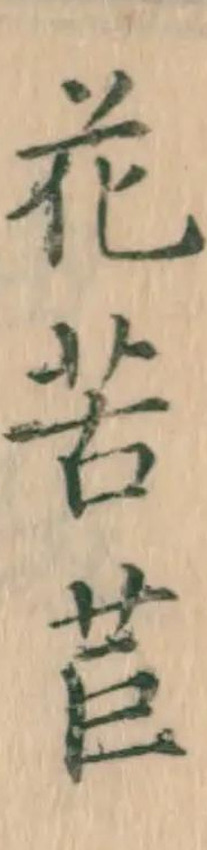花苦苣

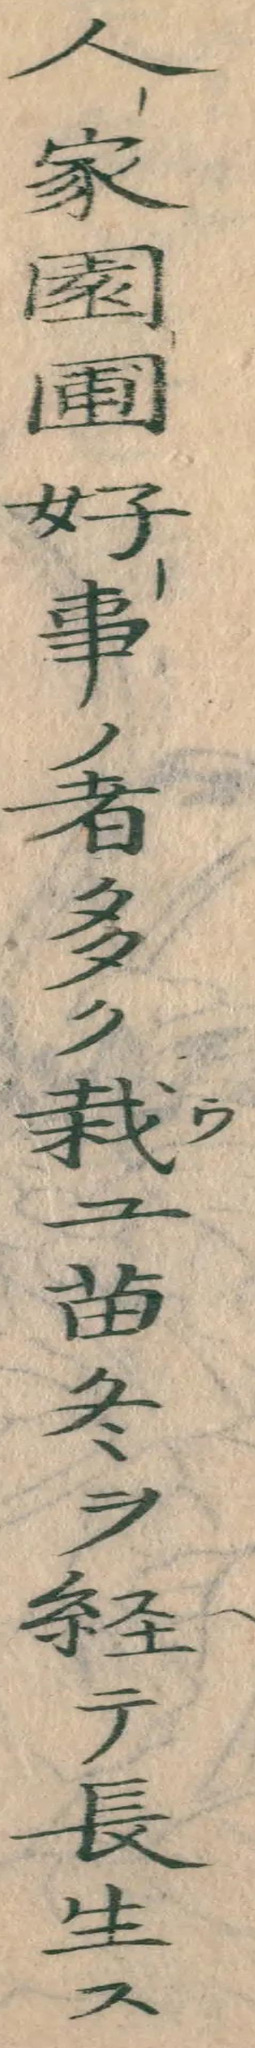人-家園-圃好-事ノ者多ク栽ユ苗冬ヲ経テ長生ス
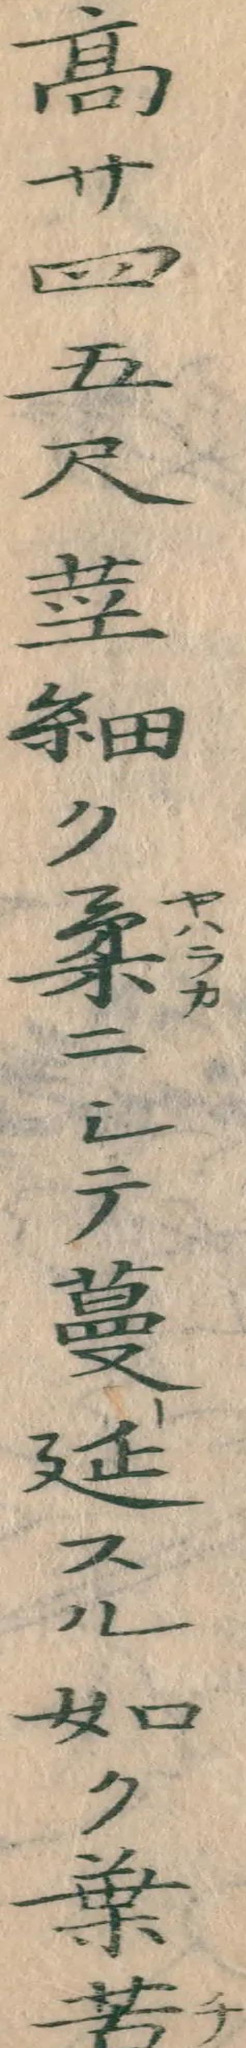高サ四五尺茎細ク柔ニシテ蔓-延スル如ク葉苦
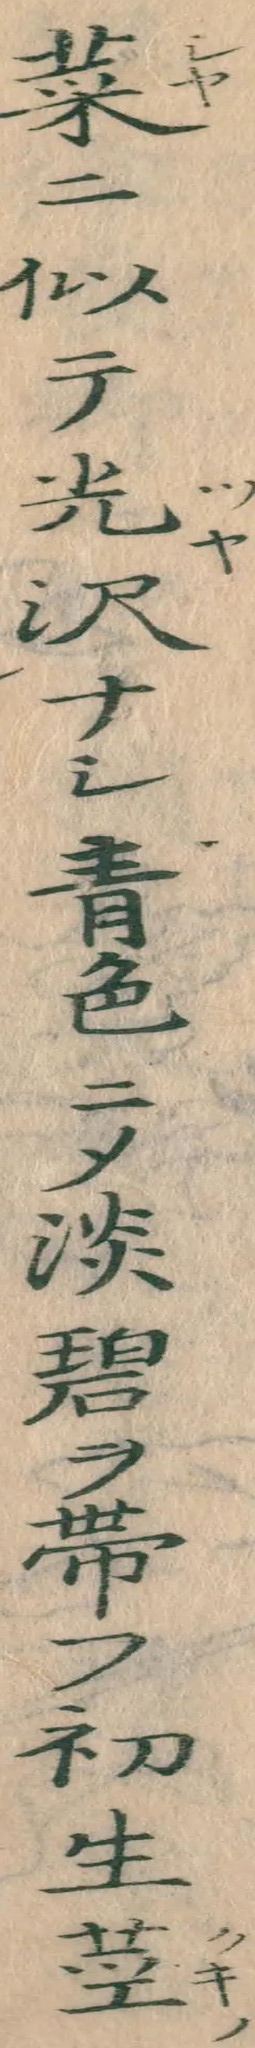菜ニ似テ光沢ナシ青色ニシテ淡碧ヲ帯フ初生茎
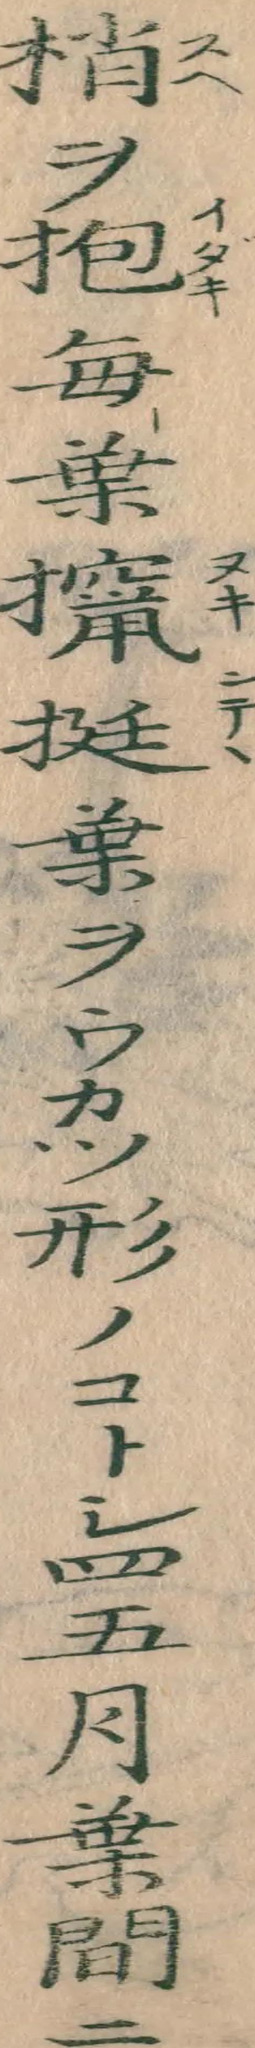梢ヲ抱毎-葉攛挺葉ヲウカツ形ノコトシ四五月葉間ニ
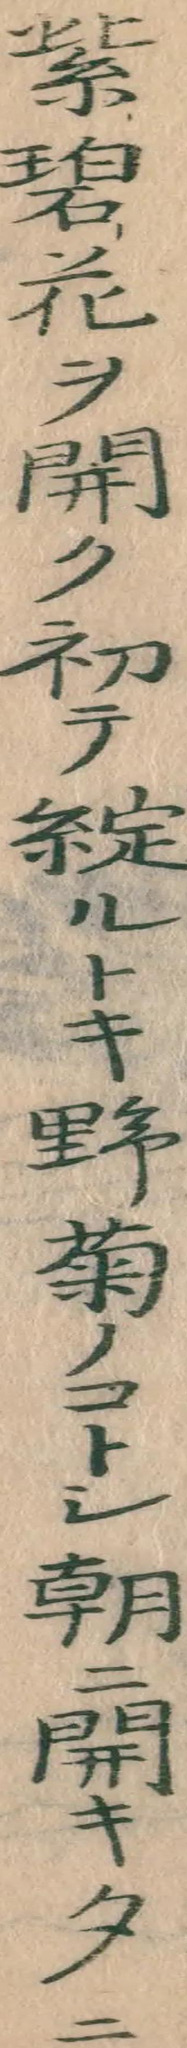紫-碧-花ヲ開ク初テ綻ルトキ野菊ノコトシ朝ニ開キ夕ニ
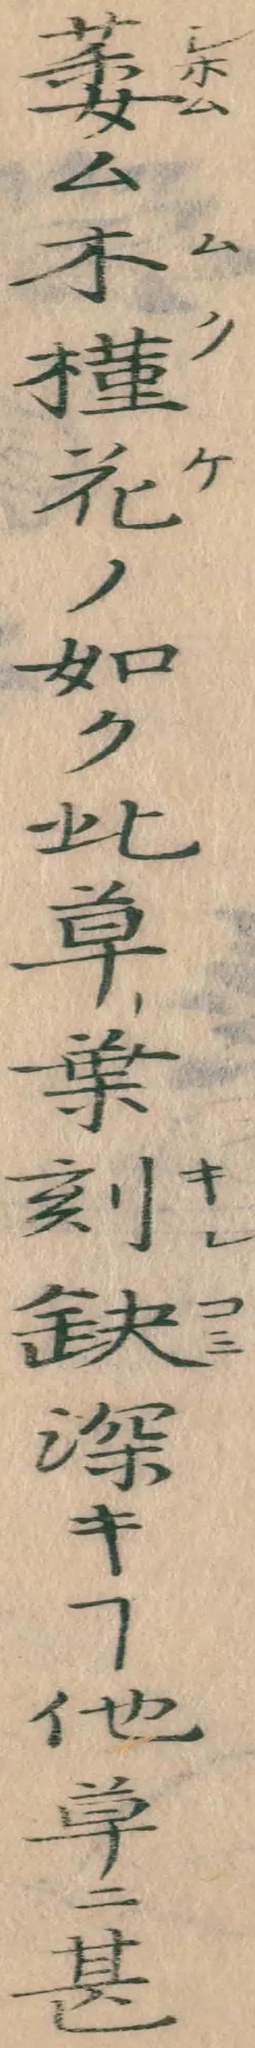萎ム木槿花ノ如ク此草-葉刻鈌深キコト他草ニ甚
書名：花彙 草部4巻木部4巻. [1]
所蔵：国立国会図書館 National Diet Library, JAPAN
